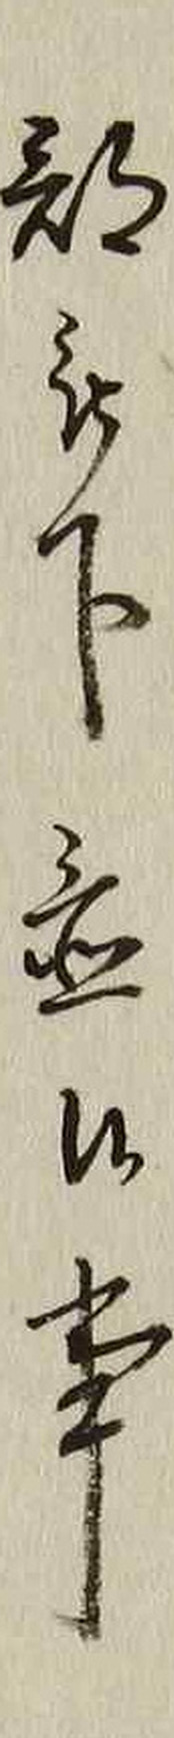部被下置候事
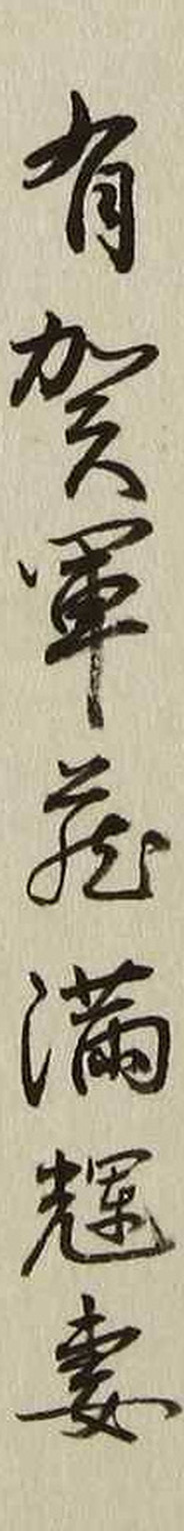女有賀軍蔵満輝妻
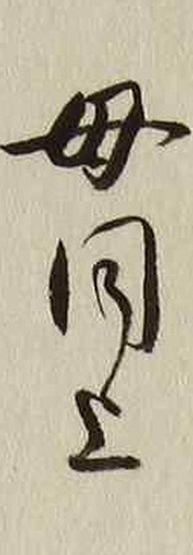母同上
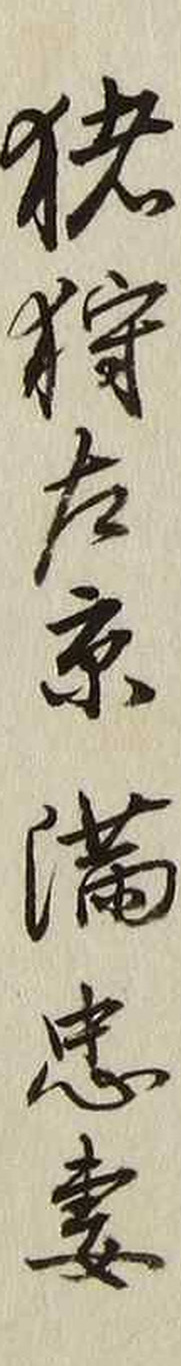女猪狩左京満忠妻
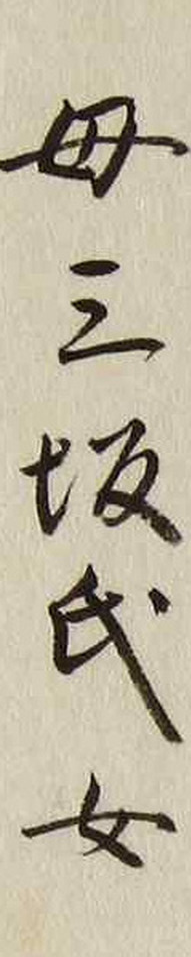母三坂氏女
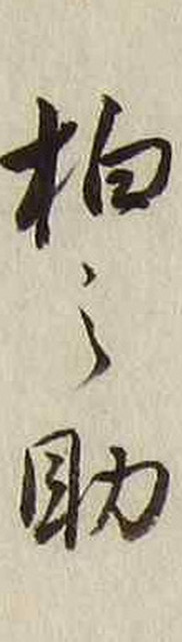柏之助

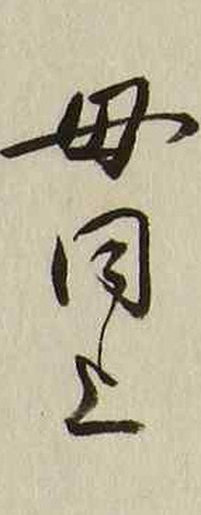母同上
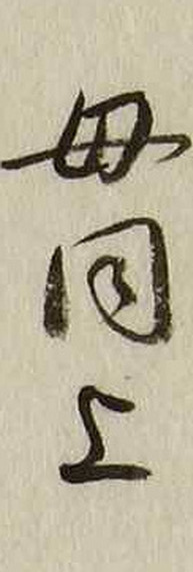母同上
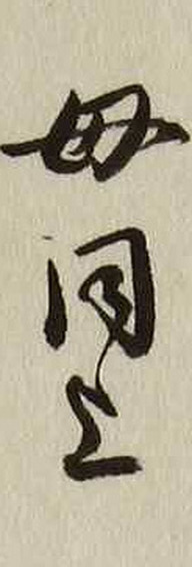母同上
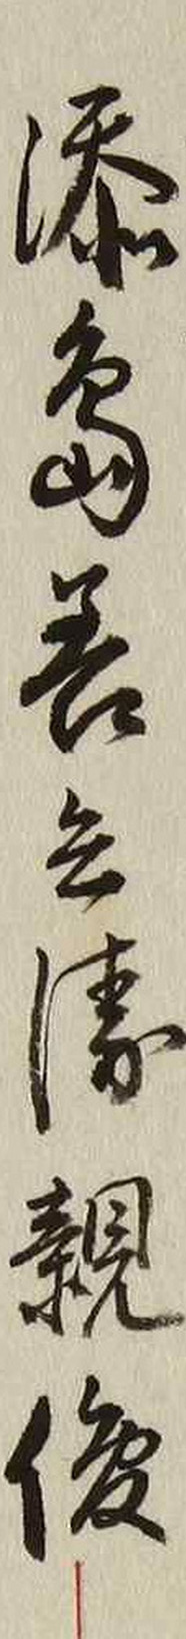添島善兵衛親俊
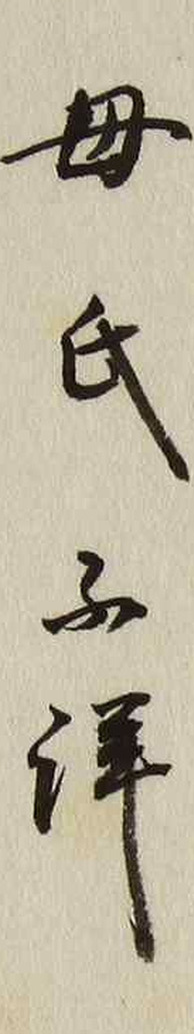母氏不詳
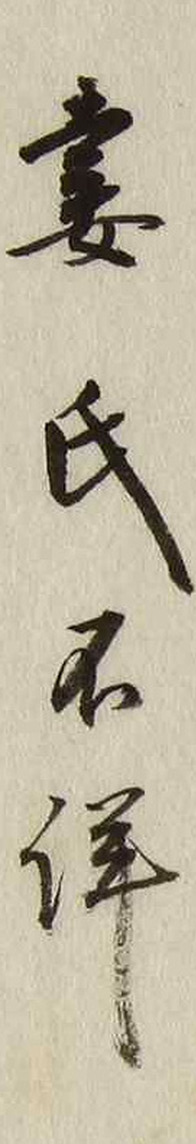妻氏不詳
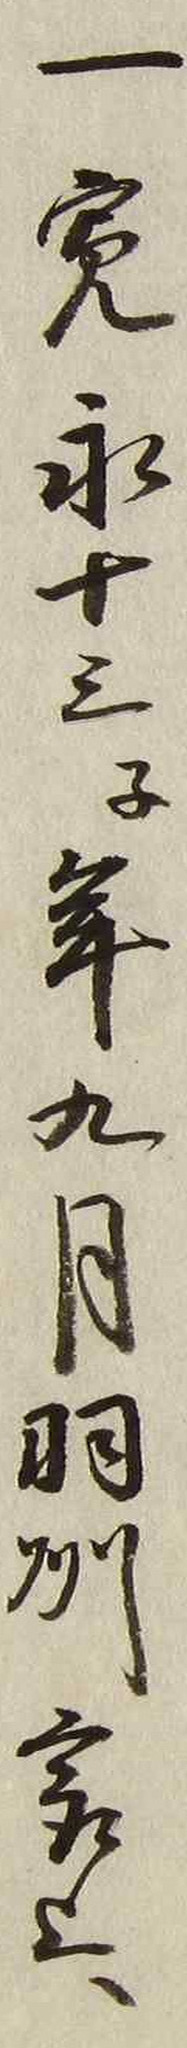一寛永十三子年九月羽州最上へ
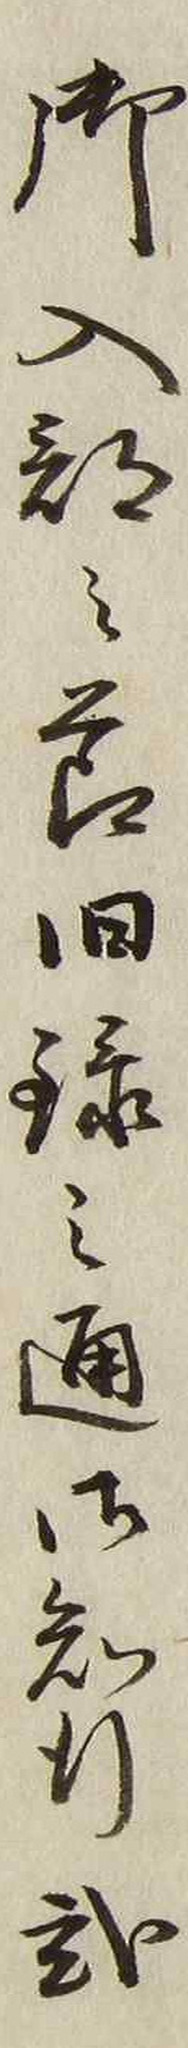御入部之節旧録之通御知行弐

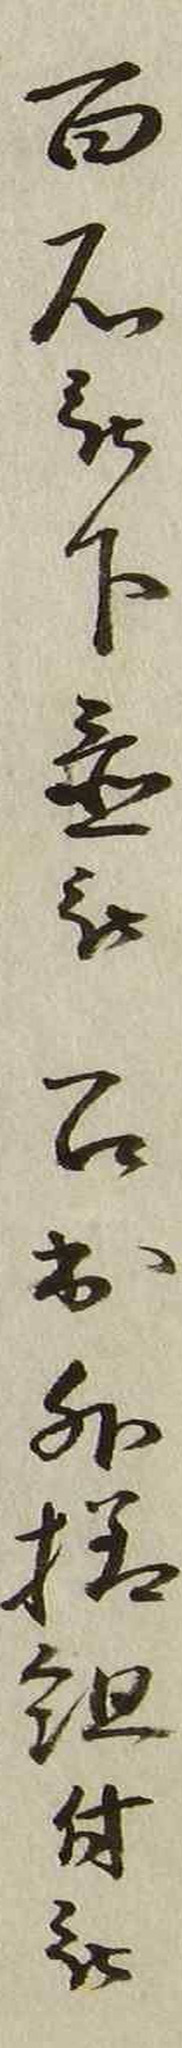百石被下置被召出外様組付被
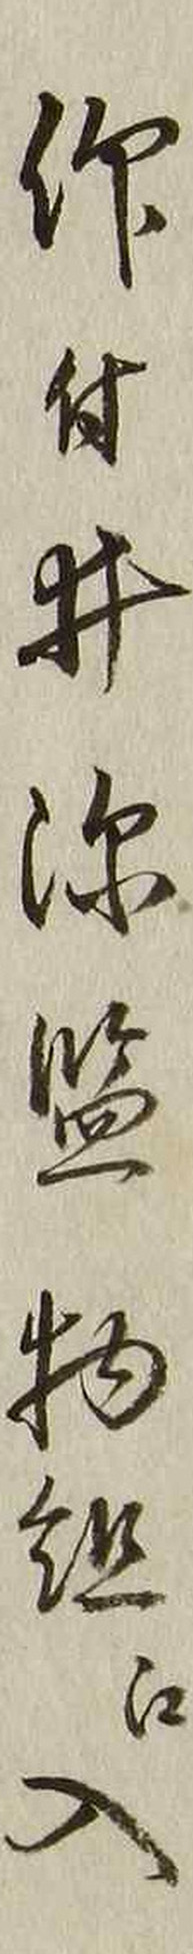仰付井深監物組江入
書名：諸士系譜　巻之149　そ之部2
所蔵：会津若松市立会津図書館
